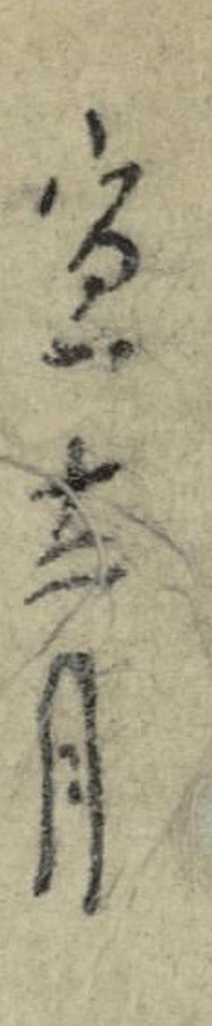寅十二月
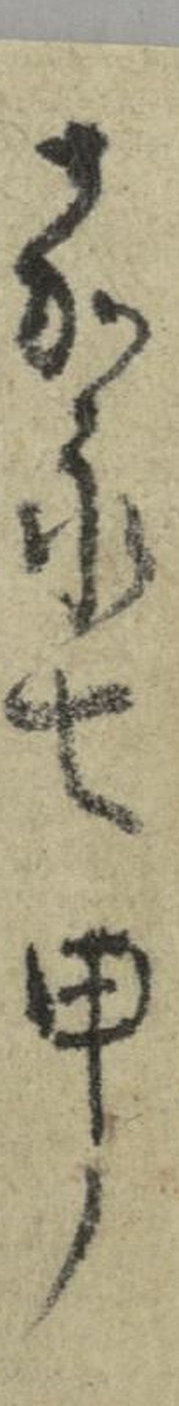嘉永七甲ノ
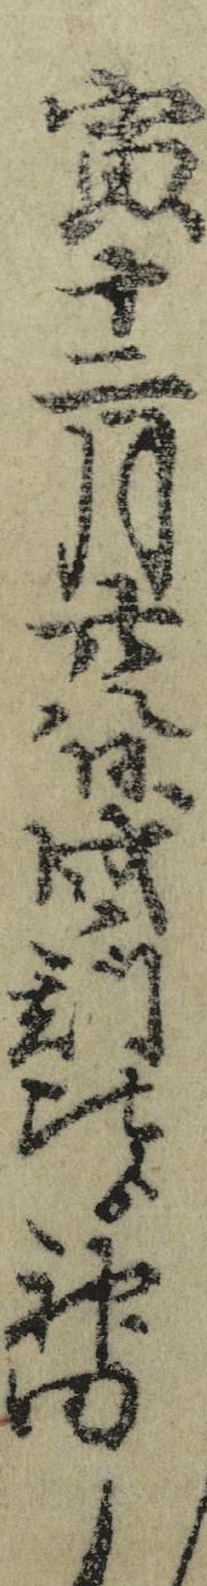寅十二月廿八日戌ノ刻頃ゟ神田
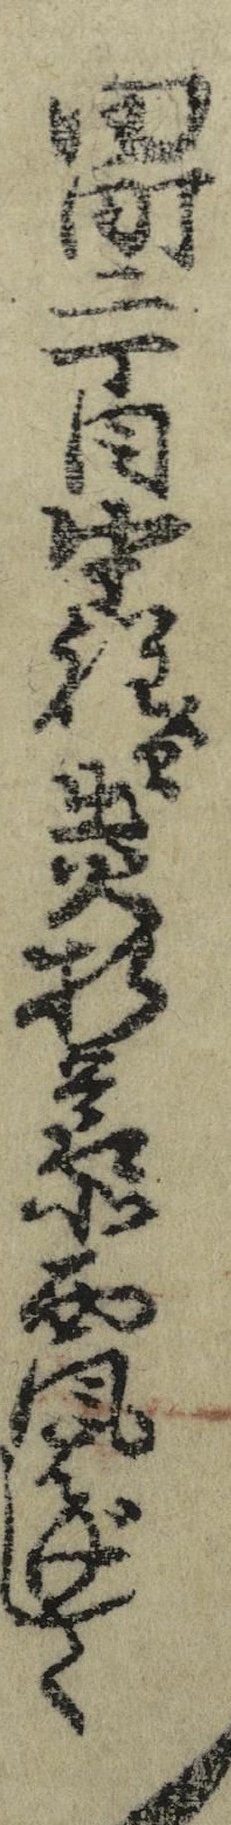田町二丁目中程ゟ出火折節北西風はげしく
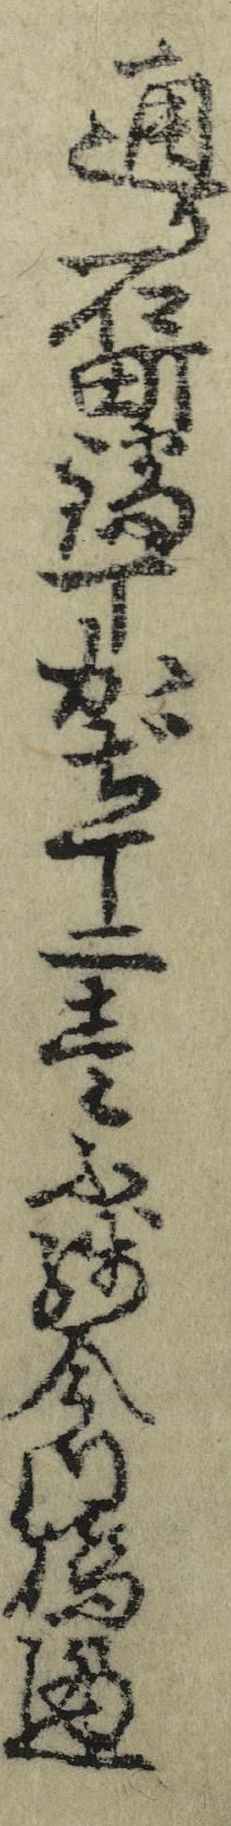通り石町鍋丁かぢ丁二壱不残今川橋通
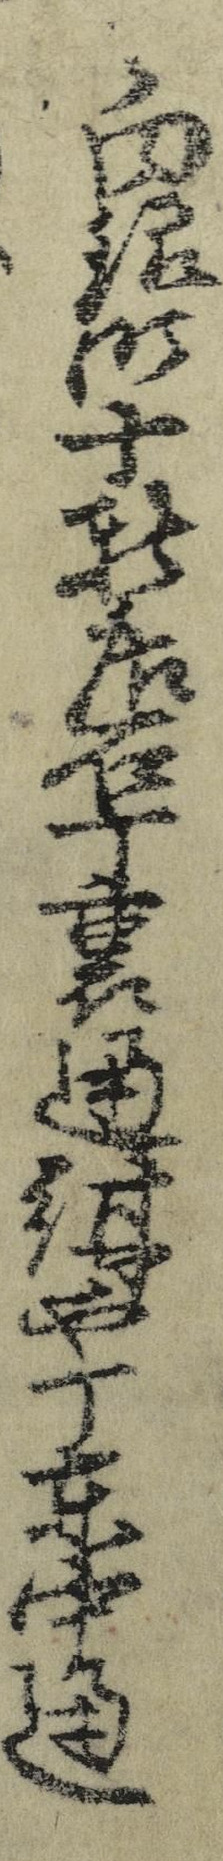白銀町十軒店石丁裏通紺や丁東中通
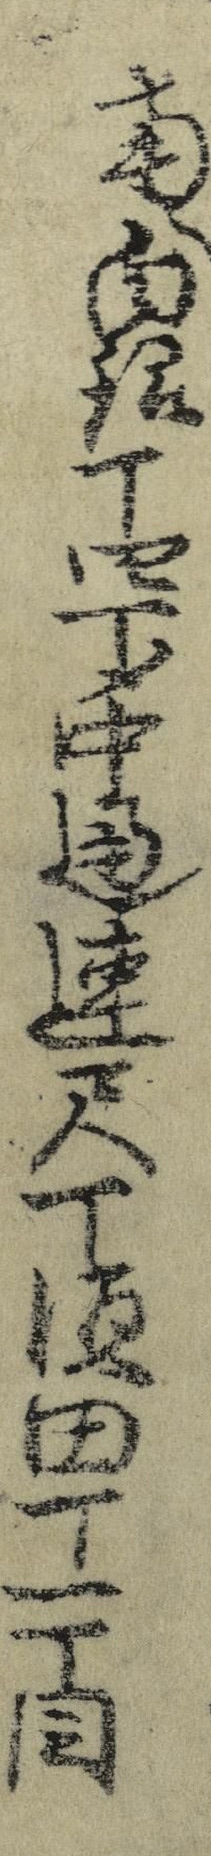南へ白銀丁四丁メ中通連尺丁須田丁一丁目
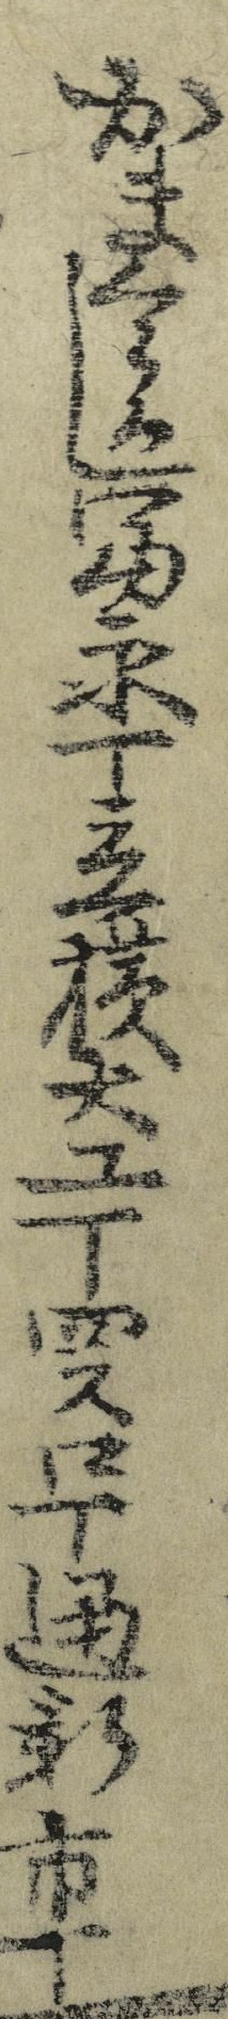かまくらかし富永丁立横大工丁関口丁通新市丁
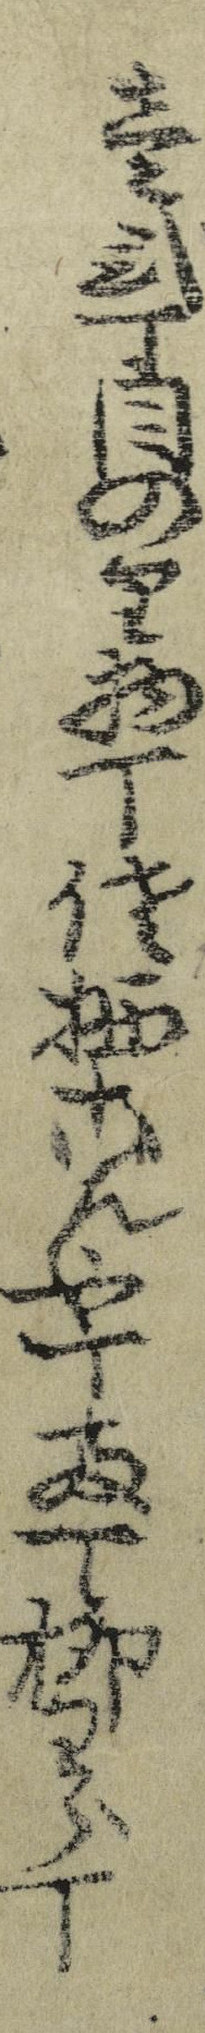壱弐丁目のり物丁佐栖こんや丁両丁柳わら丁
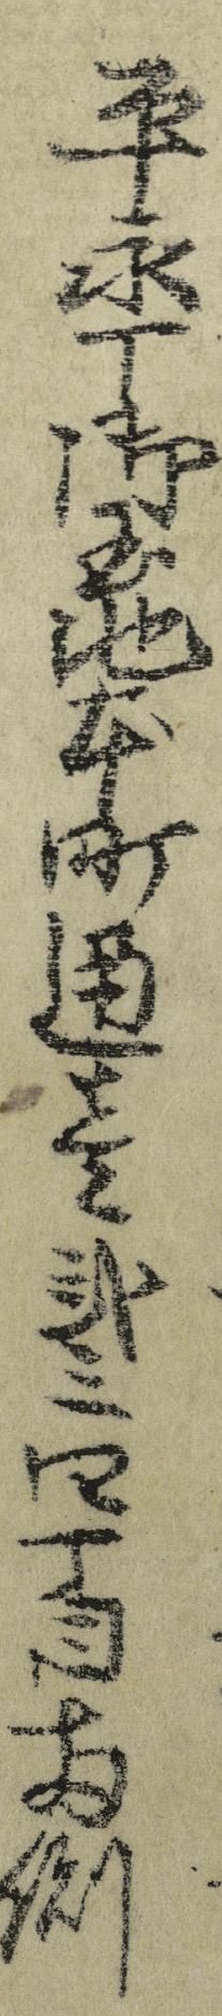平永丁御玉池本町通壱弐三四丁目両側
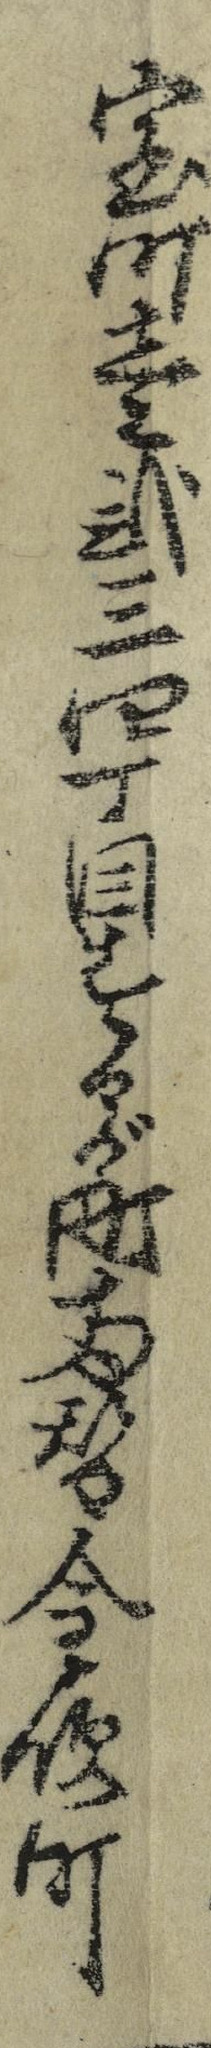宝町壱弐三四丁目するが町両替金吹町
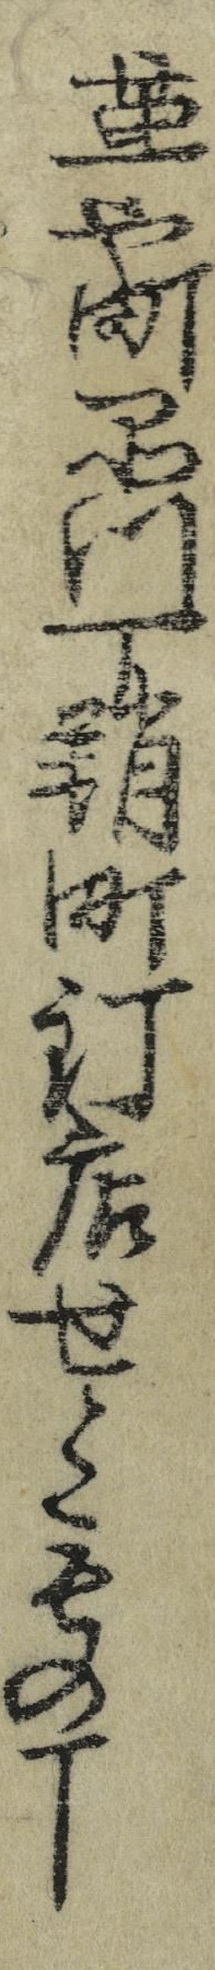革や町品川丁鞘町釘店せともの丁
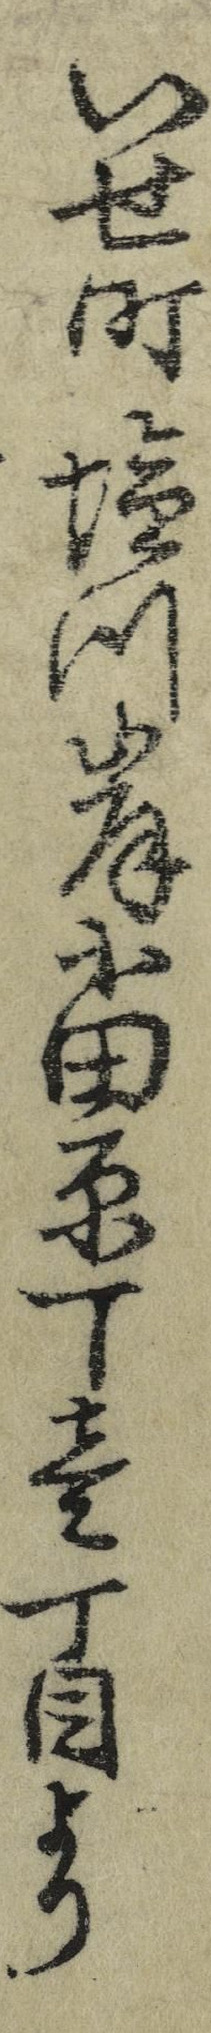いせ町塩川岸小田原丁壱丁目より
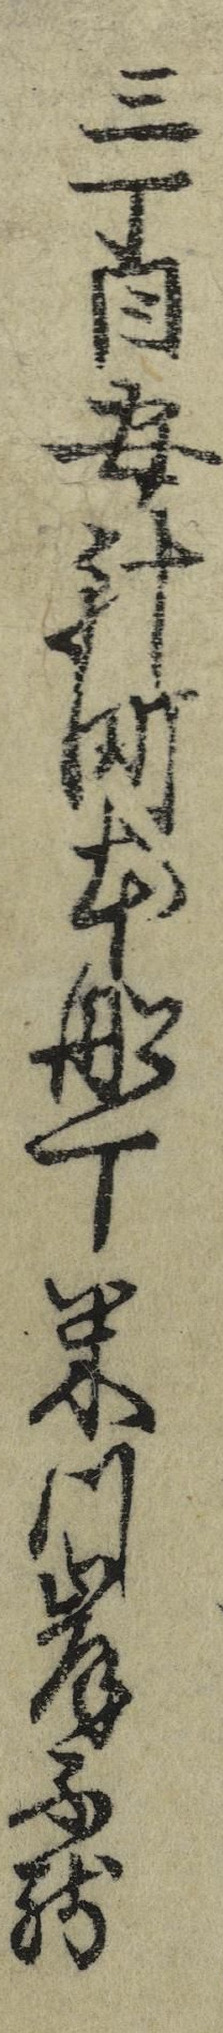三丁目安針町本船丁米川岸不残
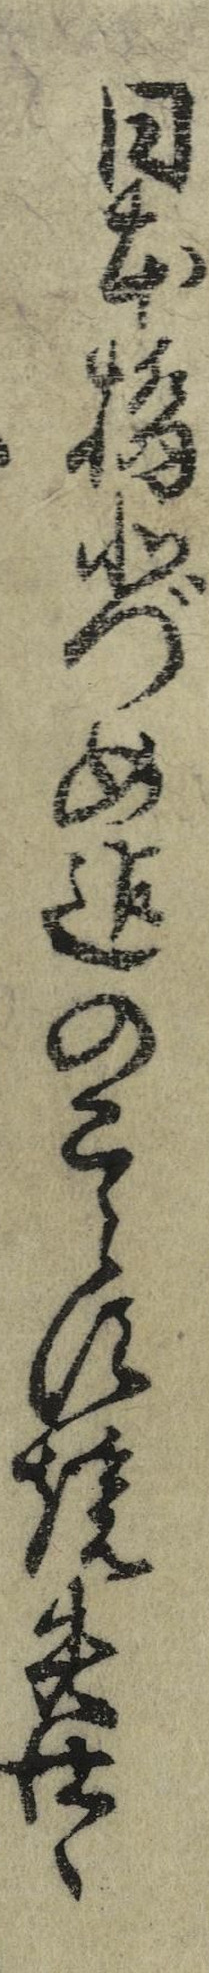日本橋北づめ迄のこらす焼失仕候
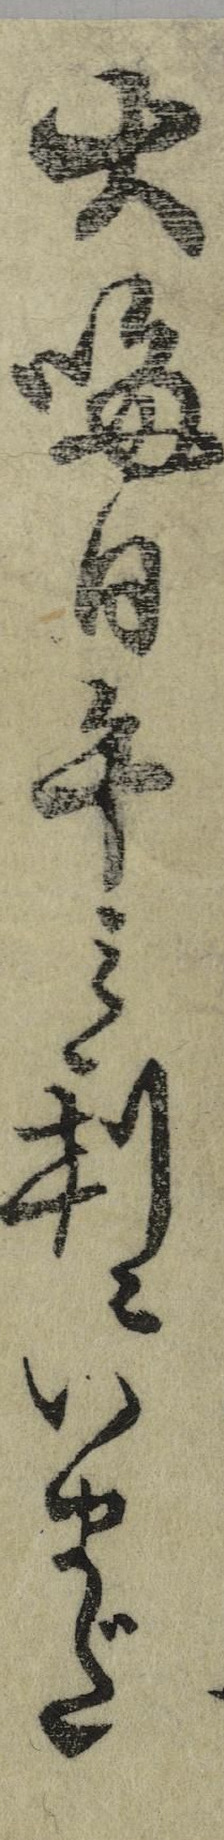大晦日午之刻にいまだ
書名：江戸大火之図
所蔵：東京大学地震研究所図書室 Earthquake Research Institute Library, The University of Tokyo, JAPAN
